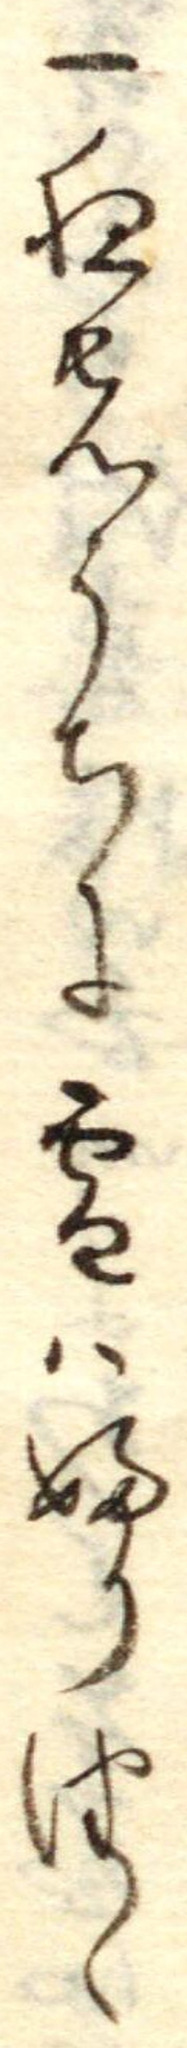一夜のうちに雪はふりつゝ
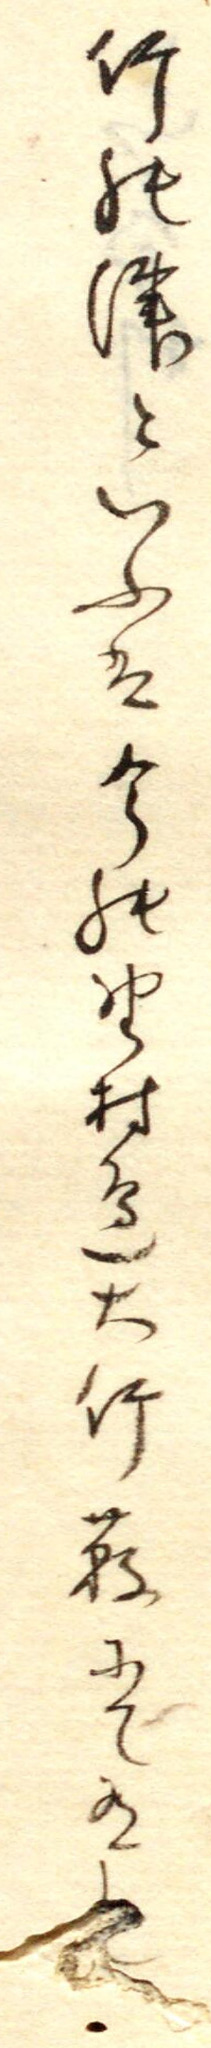竹の津といふは今の野村辺大竹薮にて有し

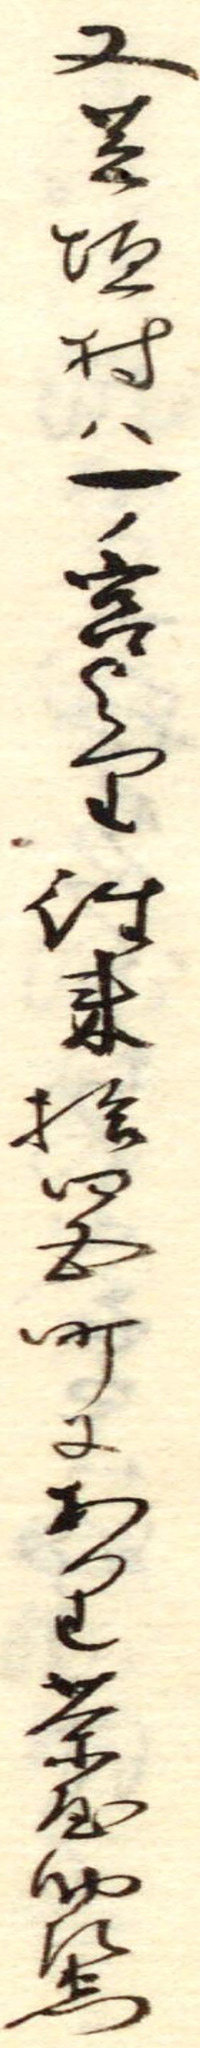又芝垣村は一ノ宮より往来拾四五町にあり茶屋助左衛門
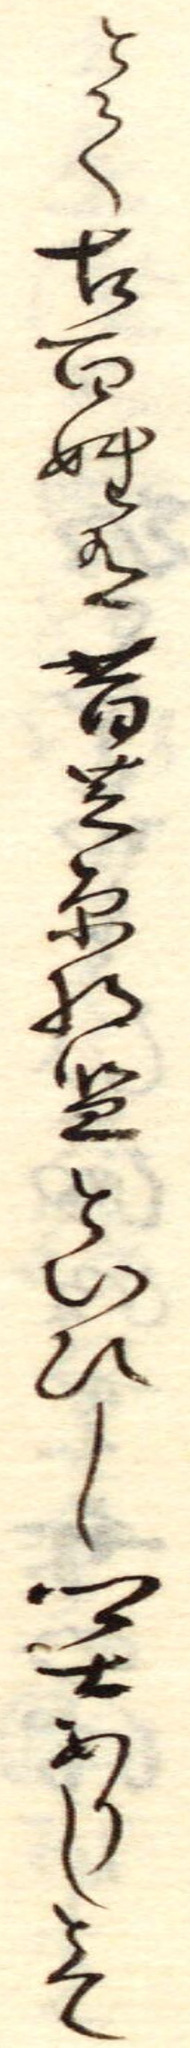とて古百姓有昔芝原将監といひし郷士ありしとて
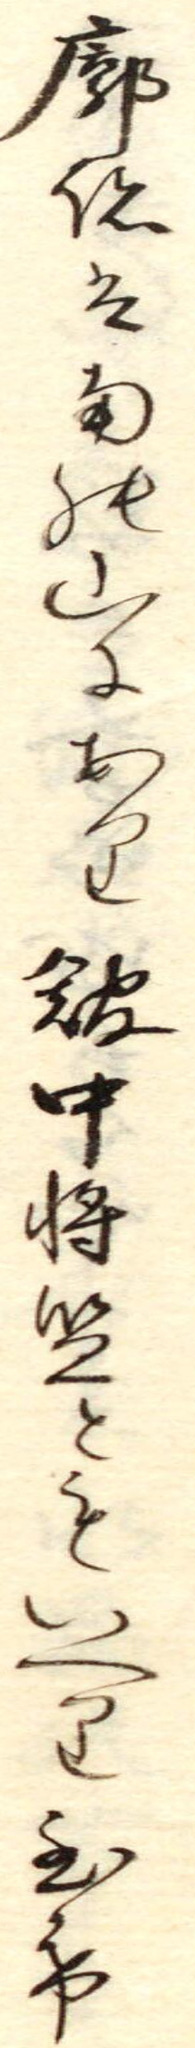廓跡は南の山にあり館中将監ともいへり至希
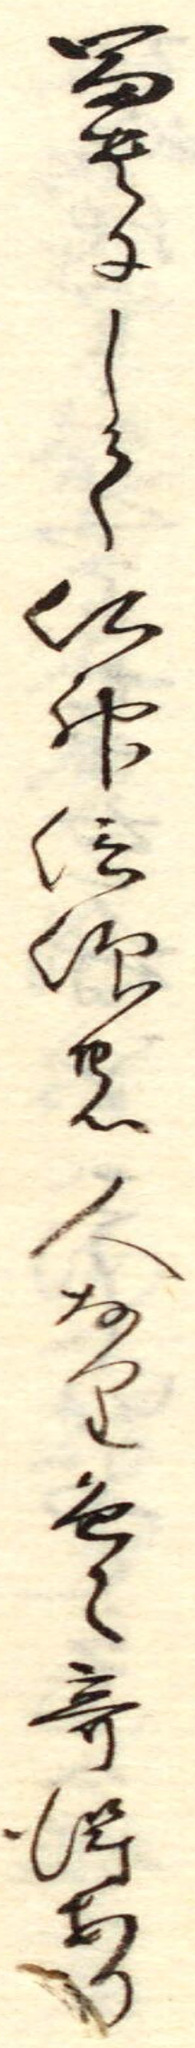富貴にして仏神信仰の人なり色々奇得あり
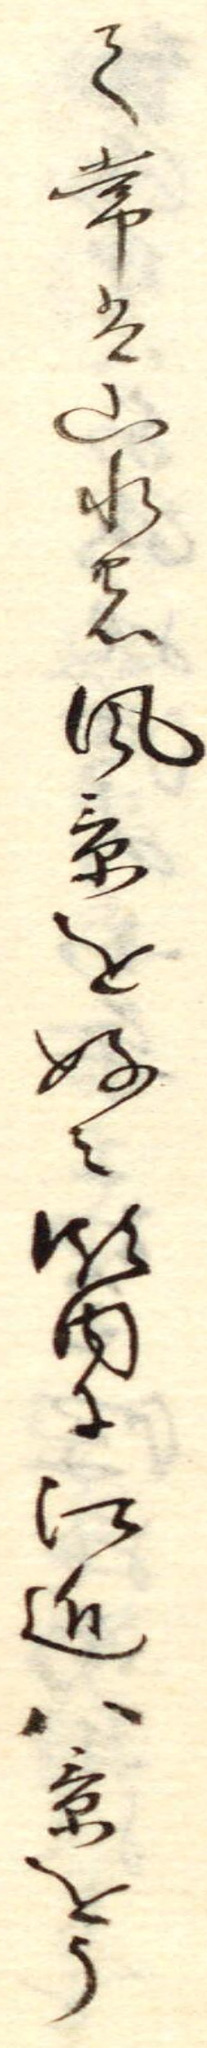て常は山水の風景を好み領内に江近は景をう
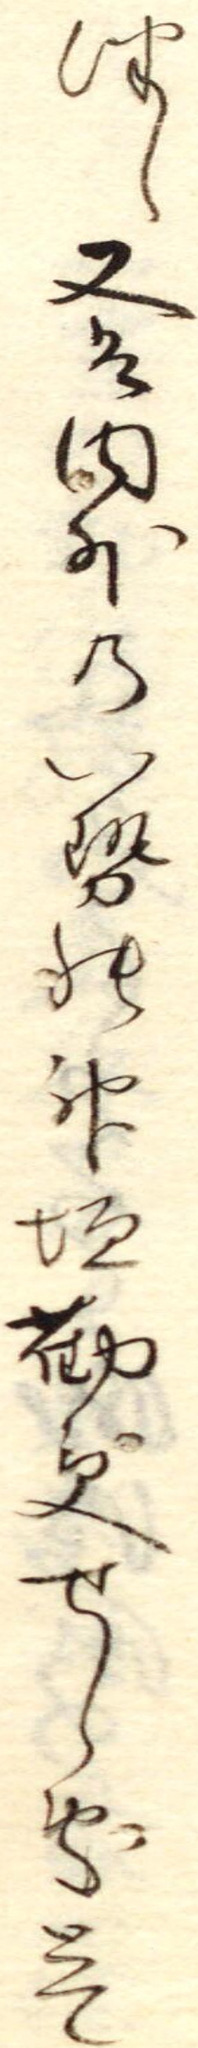つし又は内外のい勢の神垣勧受せし処とて
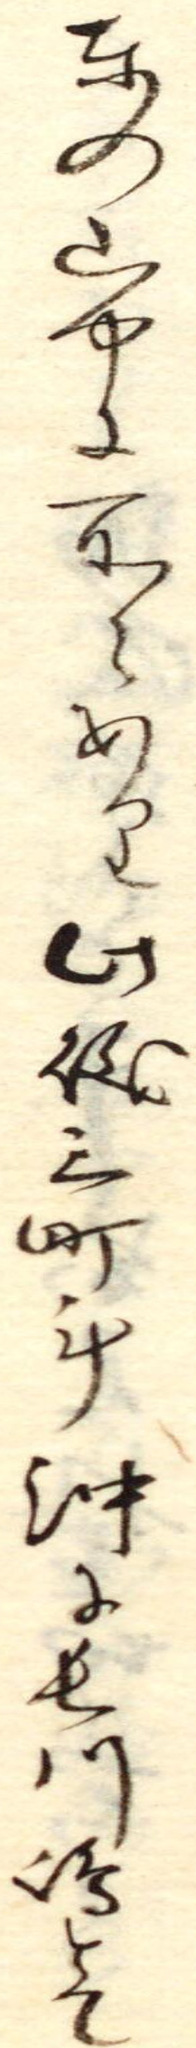東の山中に所々あり此礒三町計沖に長川嶋とて
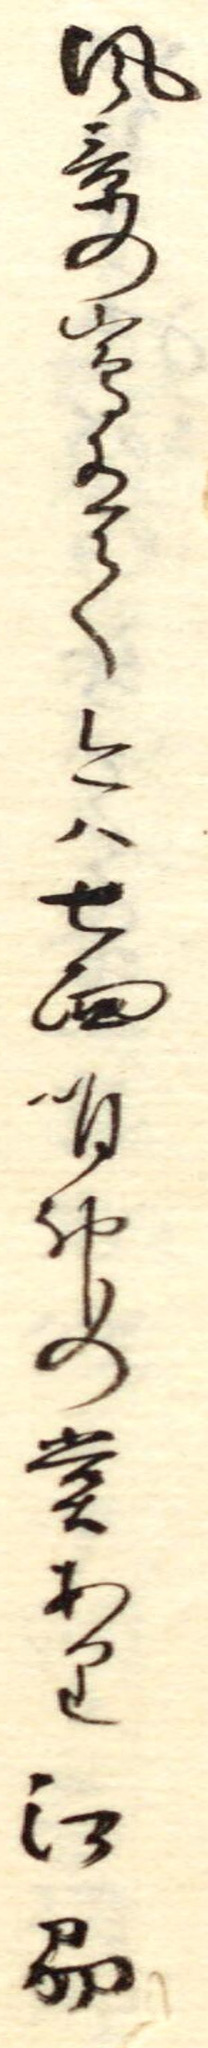風景の嶌有て今は七面明神の堂あり江州
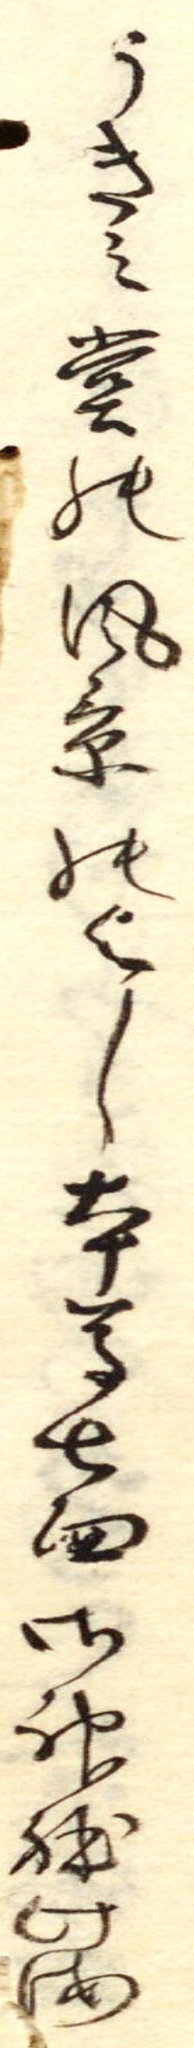うきみ堂の風景のよし本尊七面御神躰此海
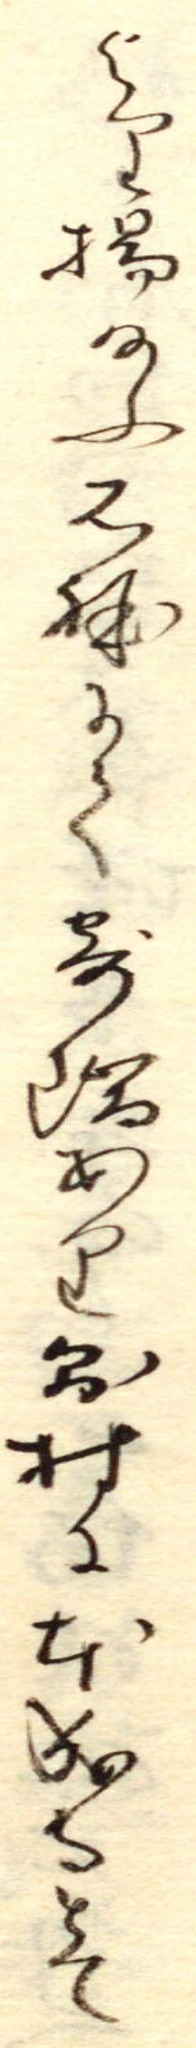より揚給ふ石躰にて寄瑞あり則村に本成寺とて
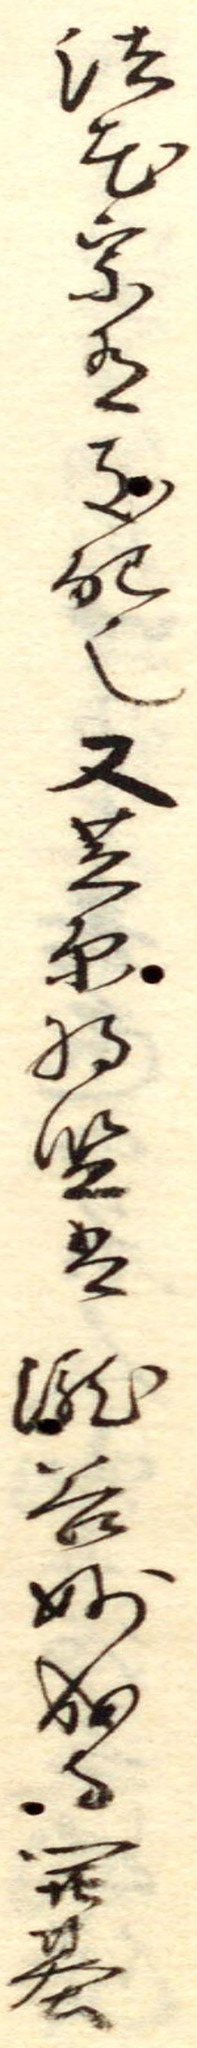法花宗有支配也又芝原将監は瀧谷妙成寺開基
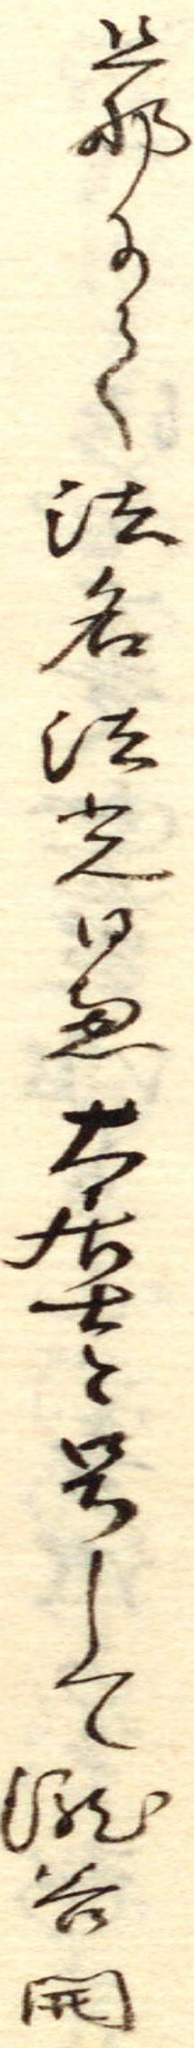旦那にて法名法光日恵大居士と号して瀧谷開
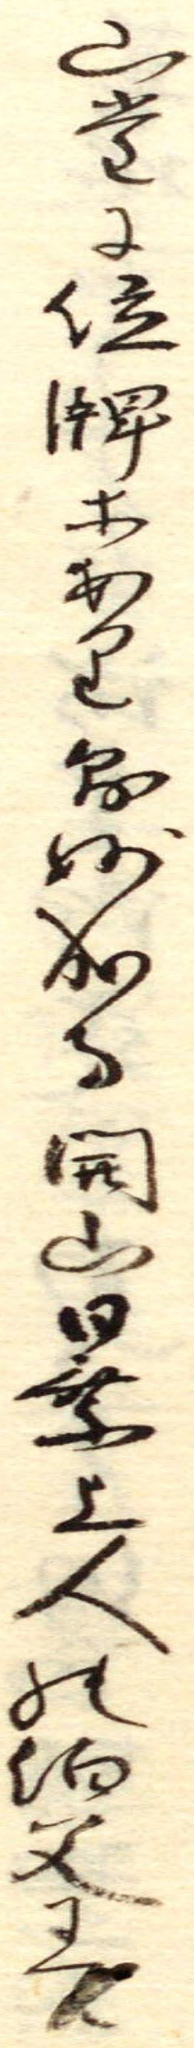山堂に位牌等あり則妙成寺開山日乗上人の伯父にて
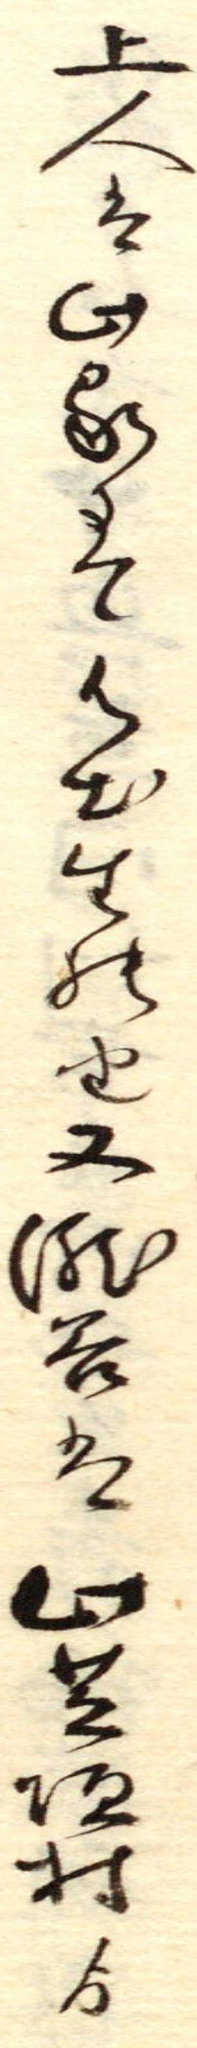上人は此家にて御出生の由又瀧谷は此芝垣村ゟ
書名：能登名跡誌
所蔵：Ishikawa Prefectural Library
